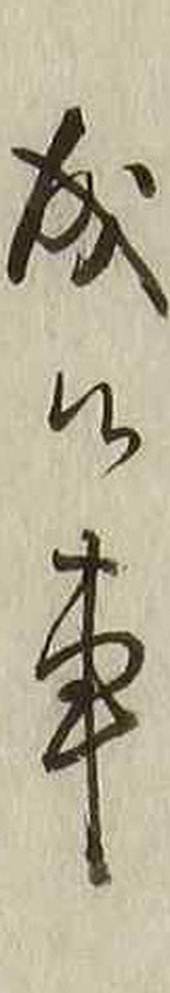成候事
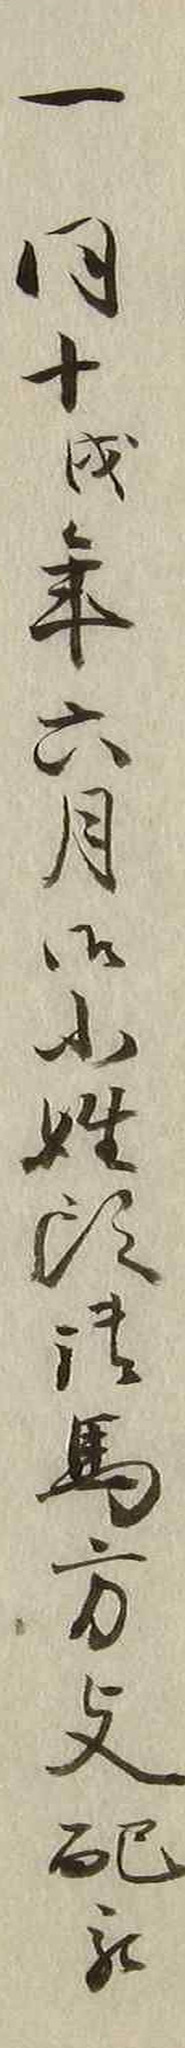一同十戌年六月御小姓頭御馬方支配被
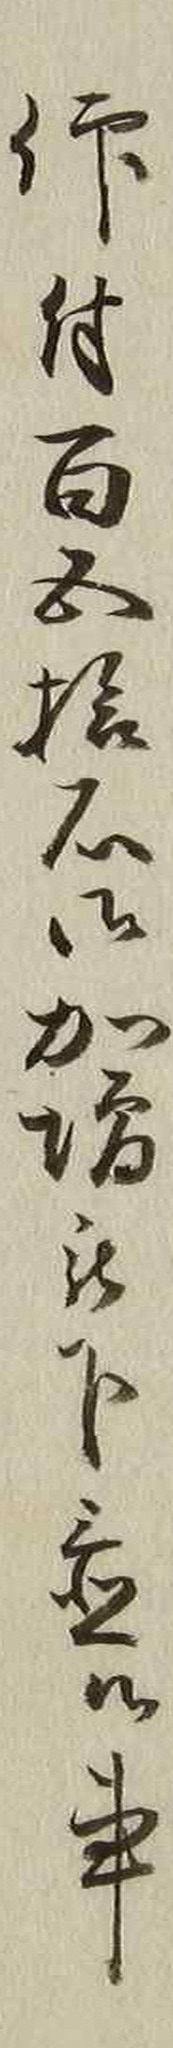仰付百五拾石御加増被下置候事
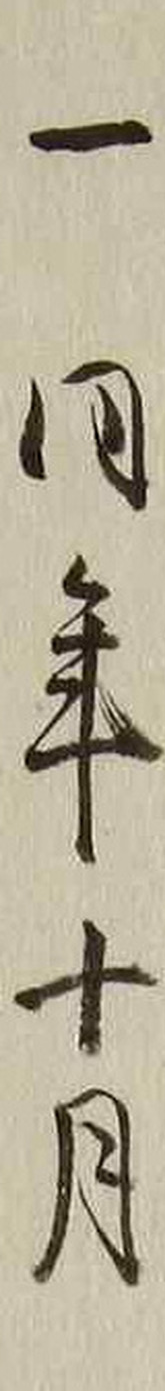一同年十月
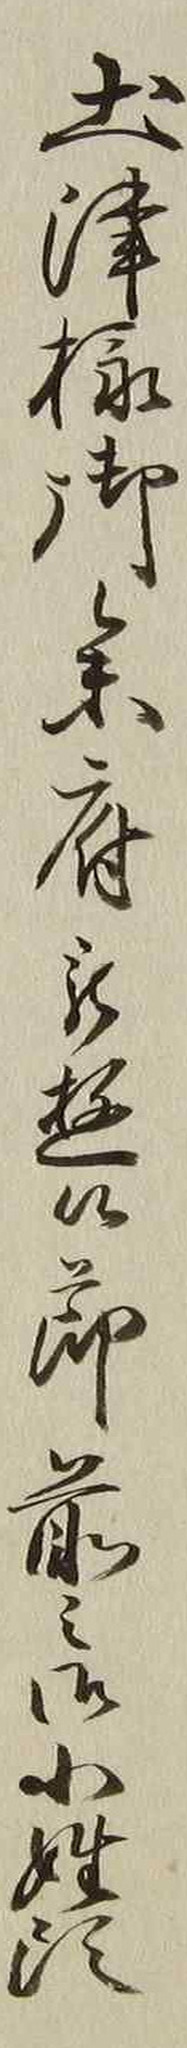土津様御参府被遊候節前之御小姓頭
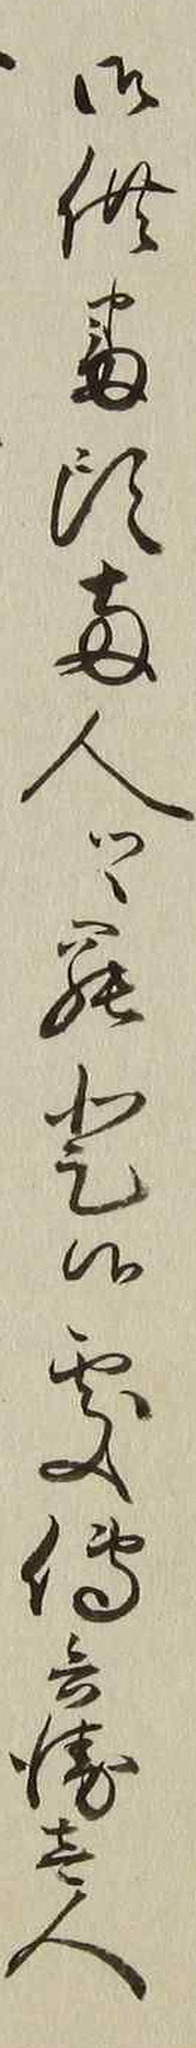御供番頭両人ツヽ罷登候処伝兵衛壱人
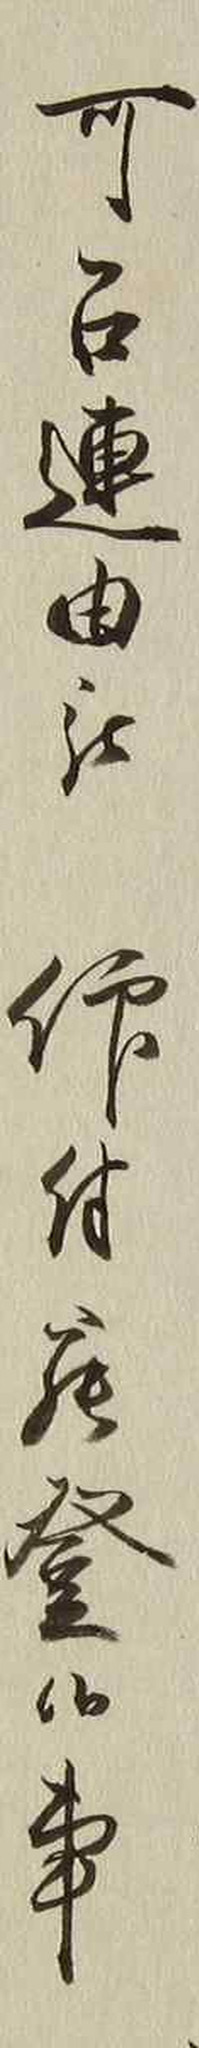可召連由被仰付罷登候事
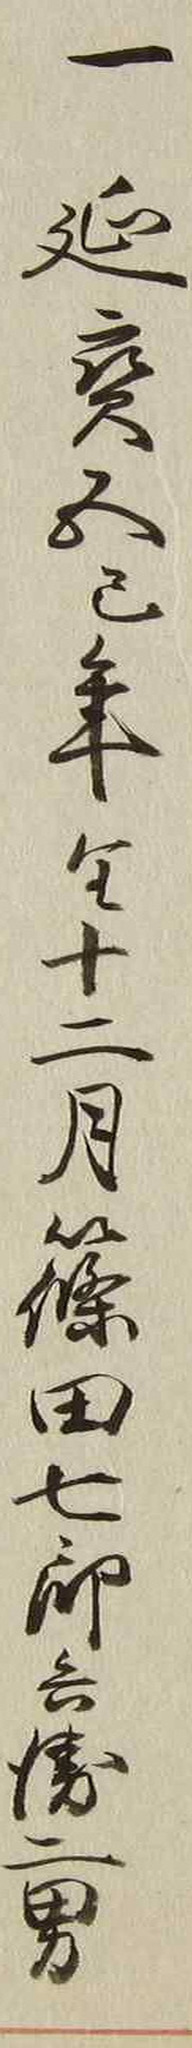一延宝五巳年閏十二月篠田七郎兵衛二男
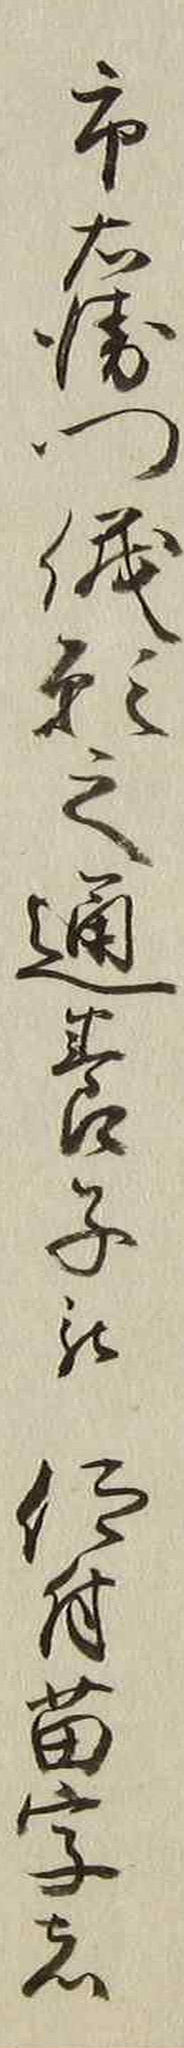市右衛門儀願之通養子被仰付苗字者
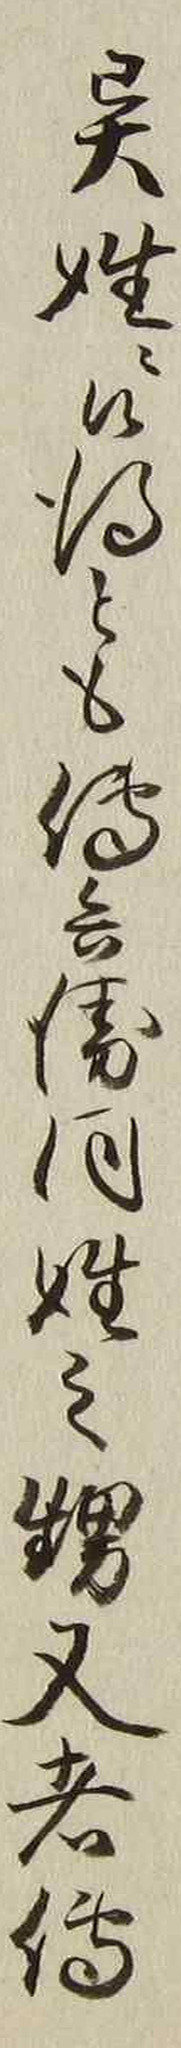異姓ニ候得とも伝兵衛同姓之甥又者伝
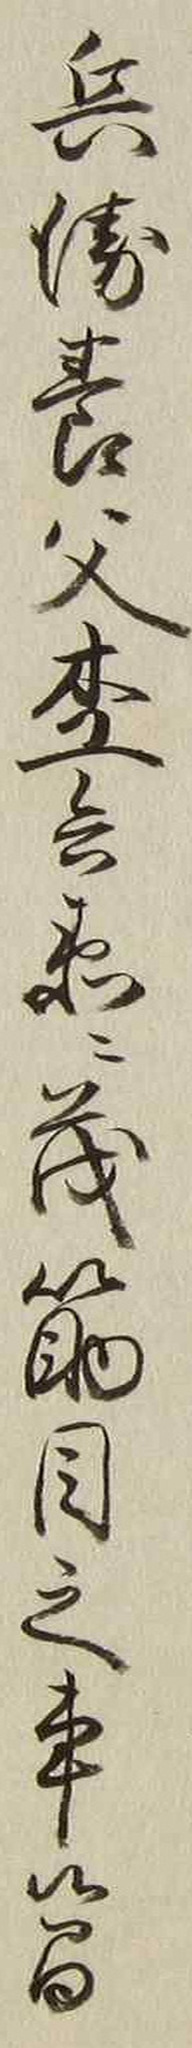兵衛養父杢兵衛ニも筋目之事候間
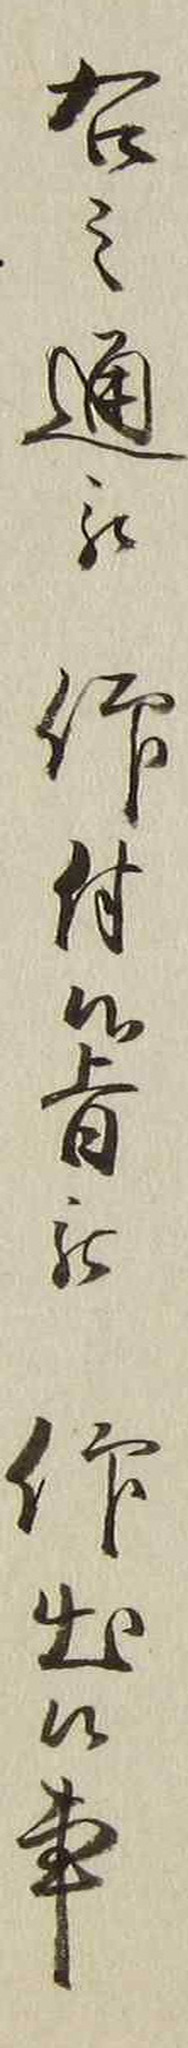右之通被仰付候旨被仰出候事
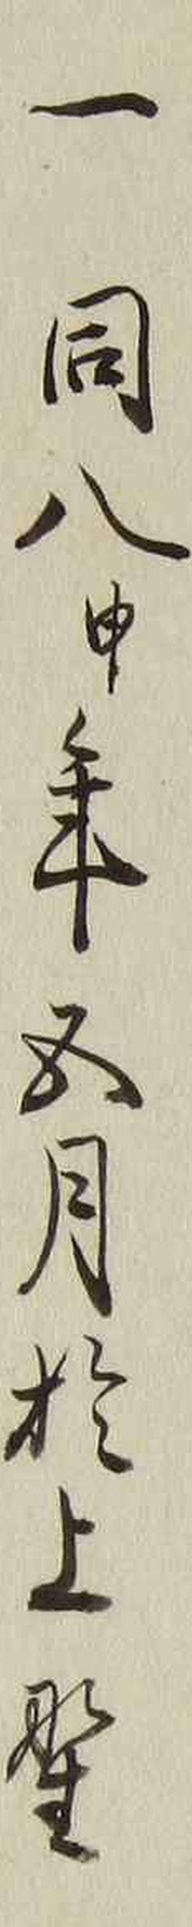一同八申年五月於上野
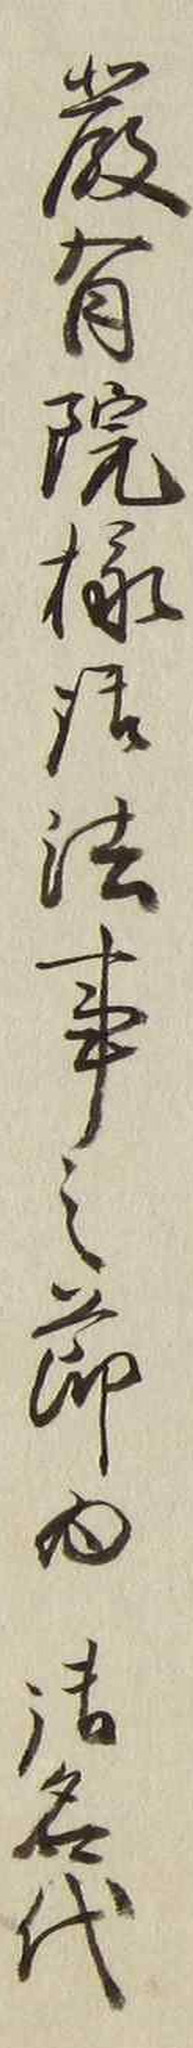厳有院様御法事之節為御名代

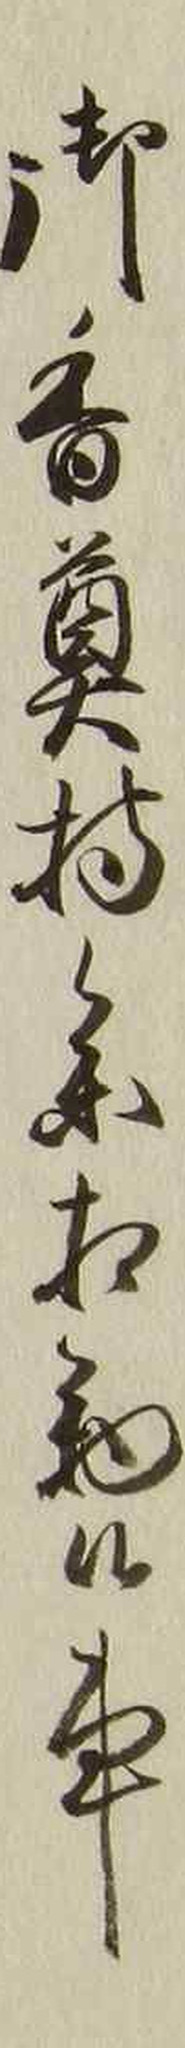御香奠持参相勤候事
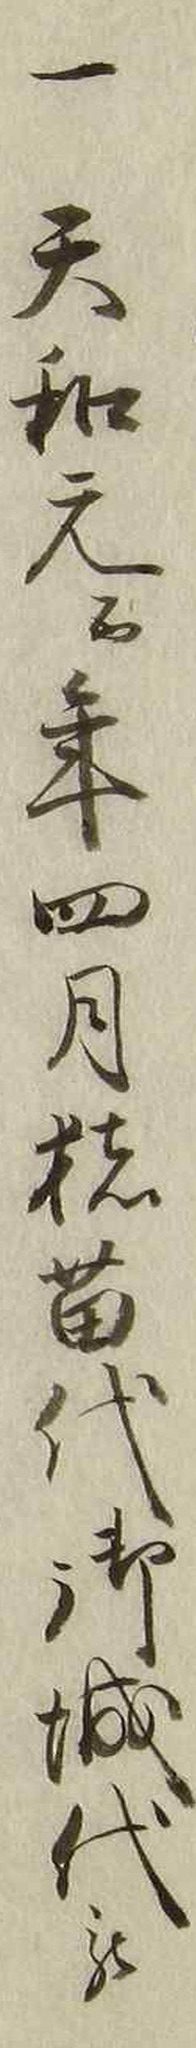一天和元酉年四月猪苗代御城代被
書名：諸士系譜　巻之15　い之部15
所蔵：会津若松市立会津図書館
